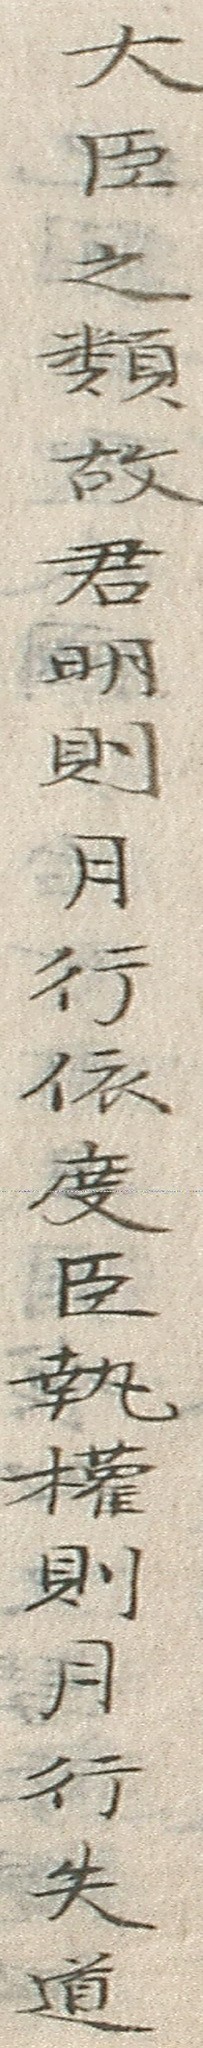大臣之類故君明則月行依度臣執権則月行失道
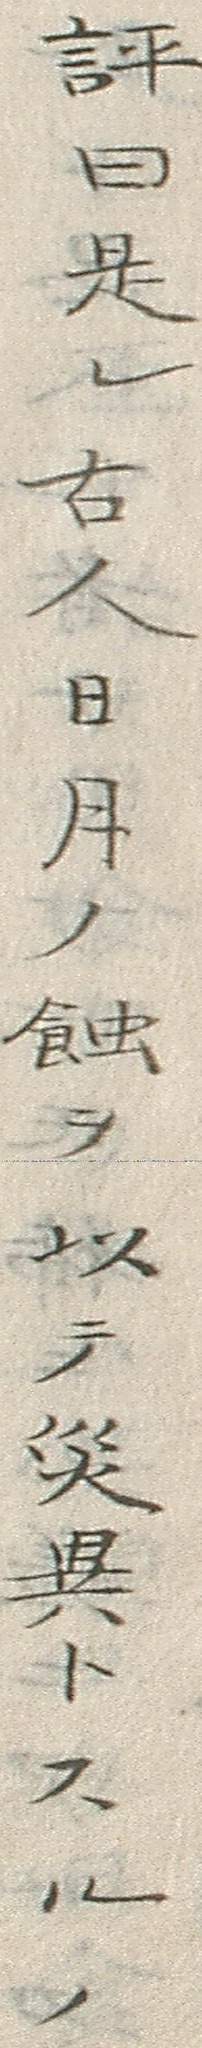評曰是レ古人日月ノ蝕ヲ以テ災異トスルノ
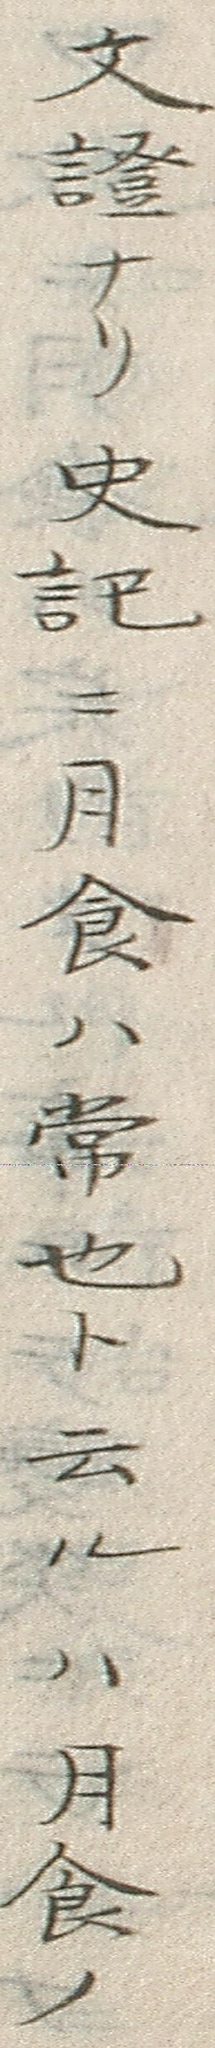文証ナリ史記ニ月食ハ常也ト云ルハ月食ノ
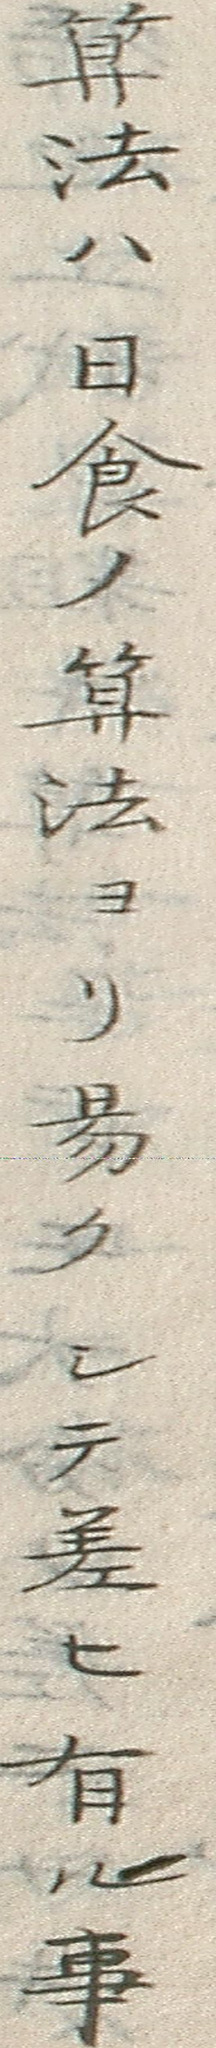算法ハ日食ノ算法ヨリ易クシテ差ヒ有ル事

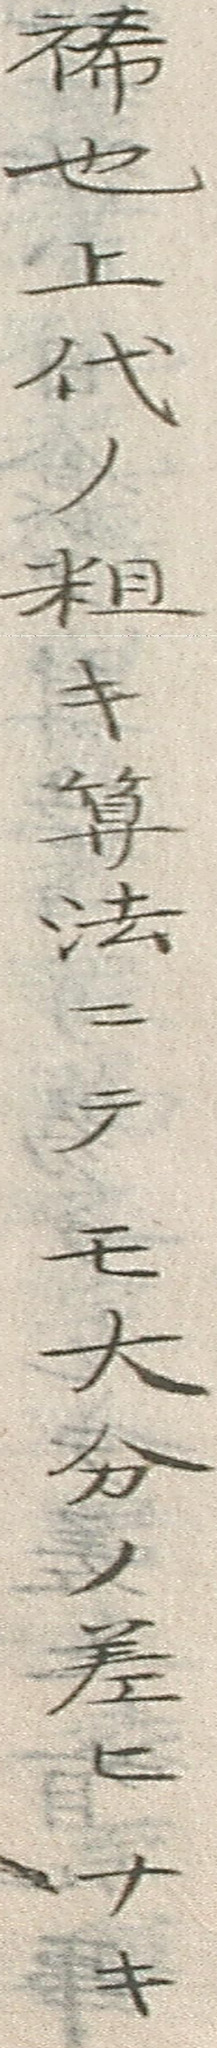稀也上代ノ粗キ算法ニテモ大分ノ差ヒナキ
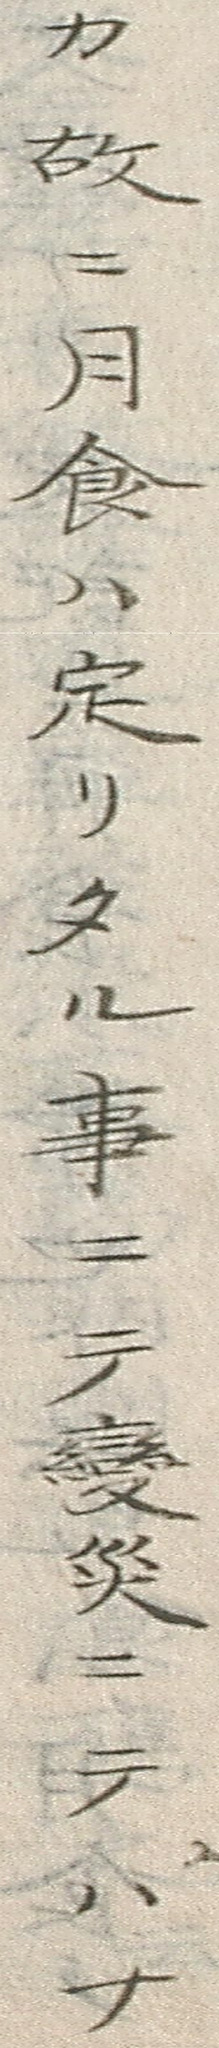カ故ニ月食ハ定リタル事ニテ変災ニテハナ
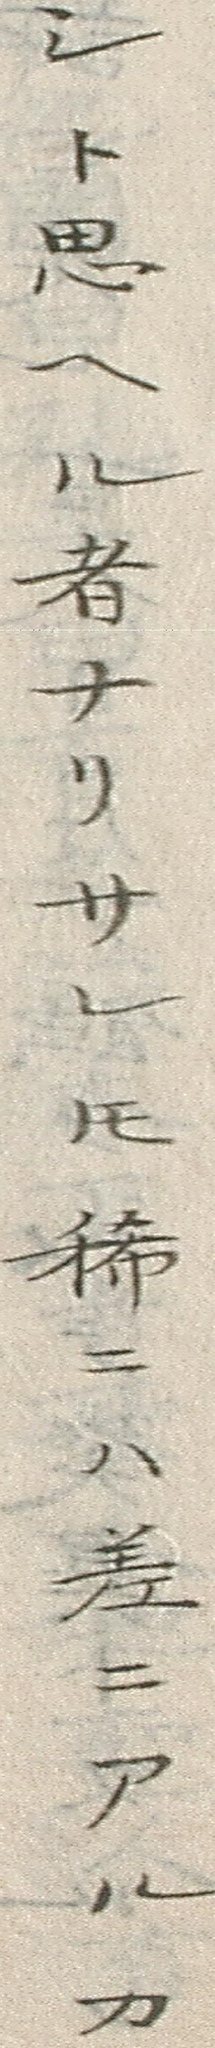シト思ヘル者ナリサレトモ稀ニハ差ニアルカ
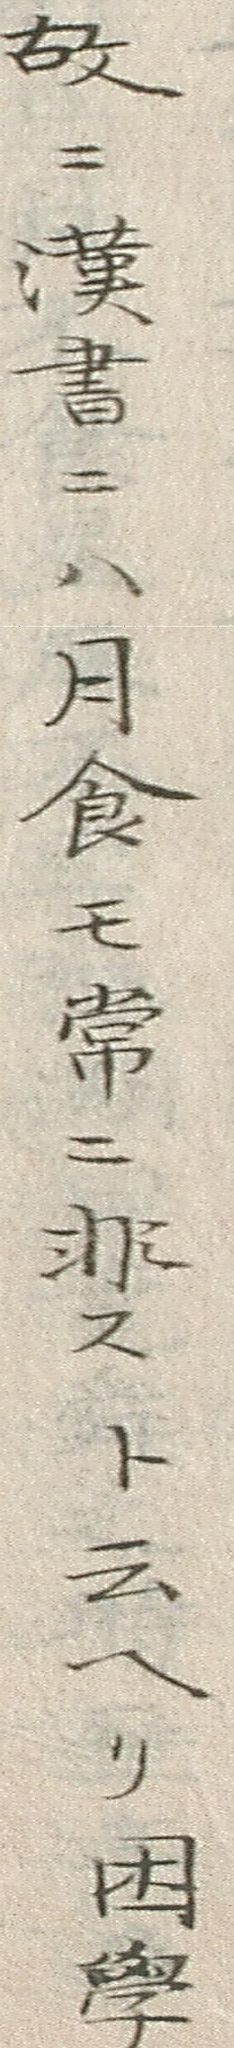故ニ漢書ニハ月食モ常ニ非スト云ヘリ困学
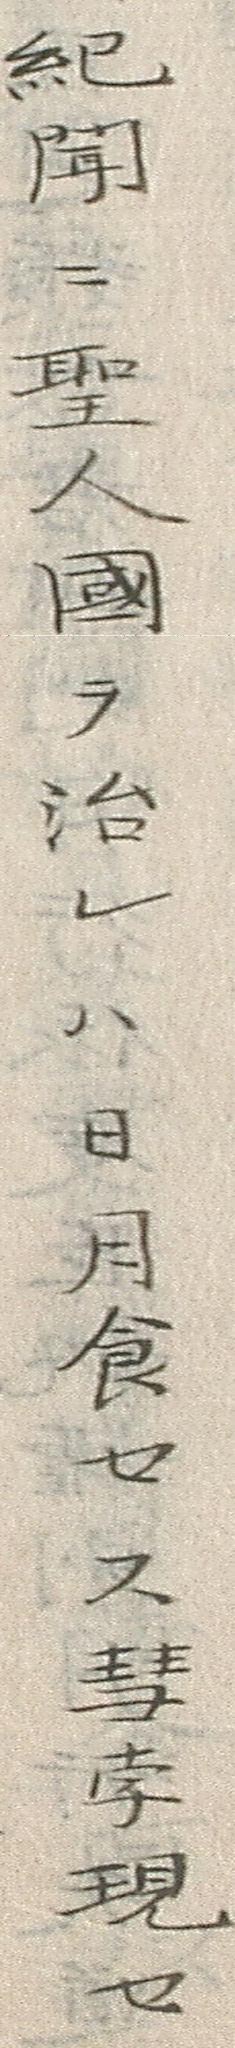紀聞ニ聖人国ヲ治レハ日月食セス彗孛現セ
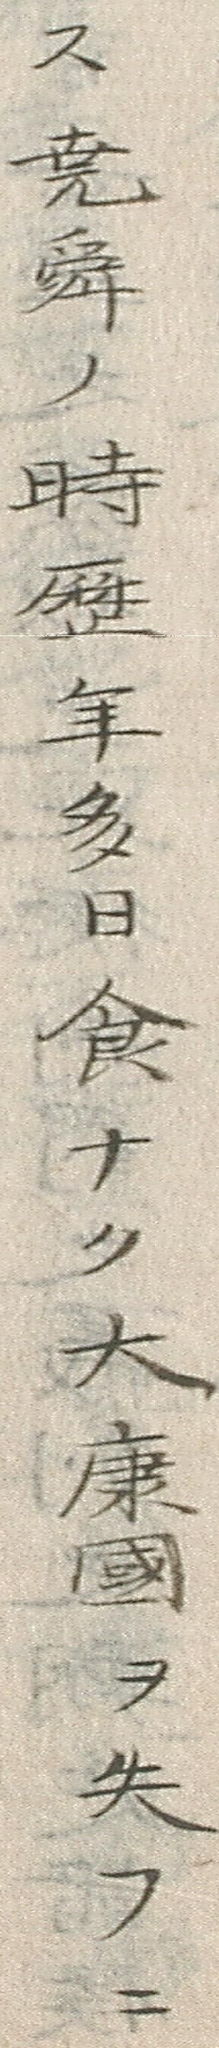ス尭舜ノ時歴年多日食ナク大康国ヲ失フニ
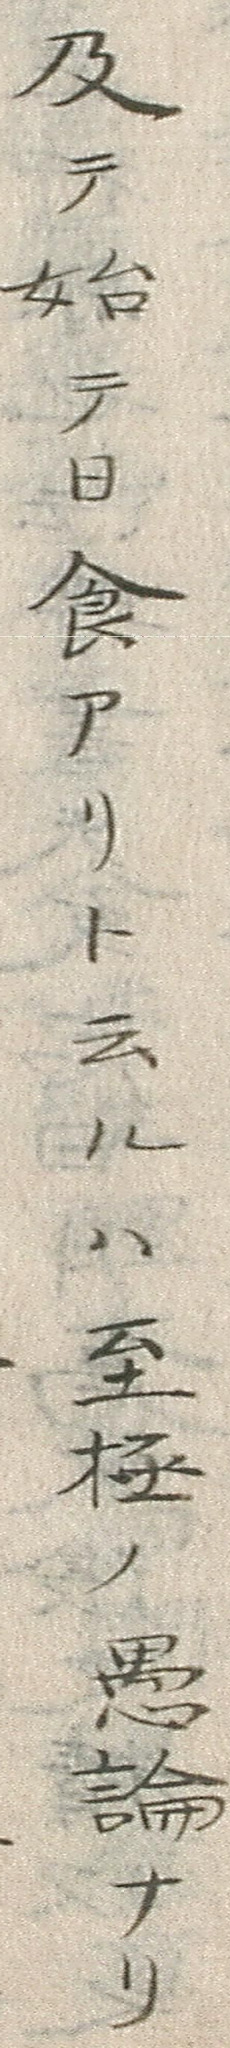及テ始テ日食アリト云ルハ至極ノ愚論ナリ
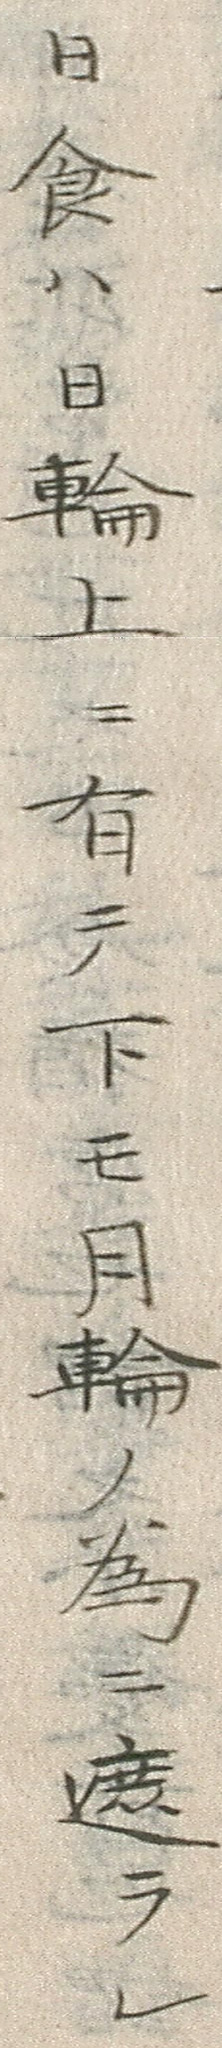日食ハ日輪上ニ有テ下モ月輪ノ為ニ遮ラレ
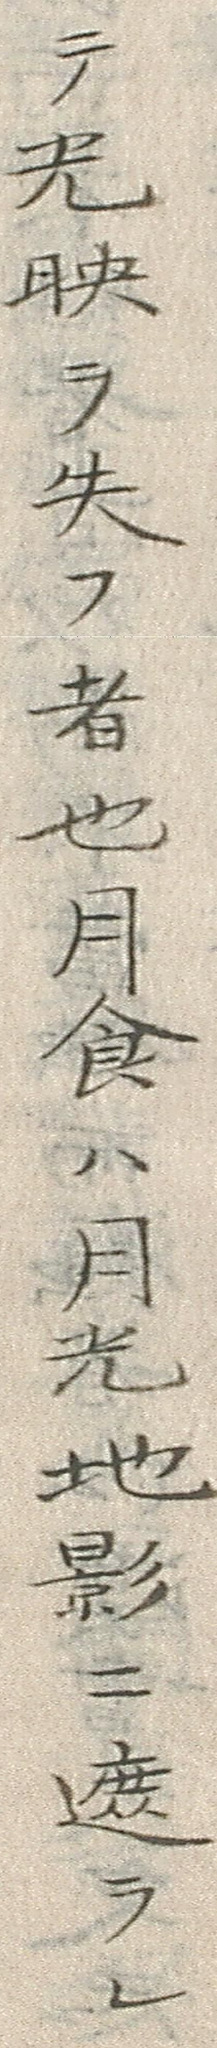テ光映ヲ失フ者也月食ハ月光地影ニ遮ラレ
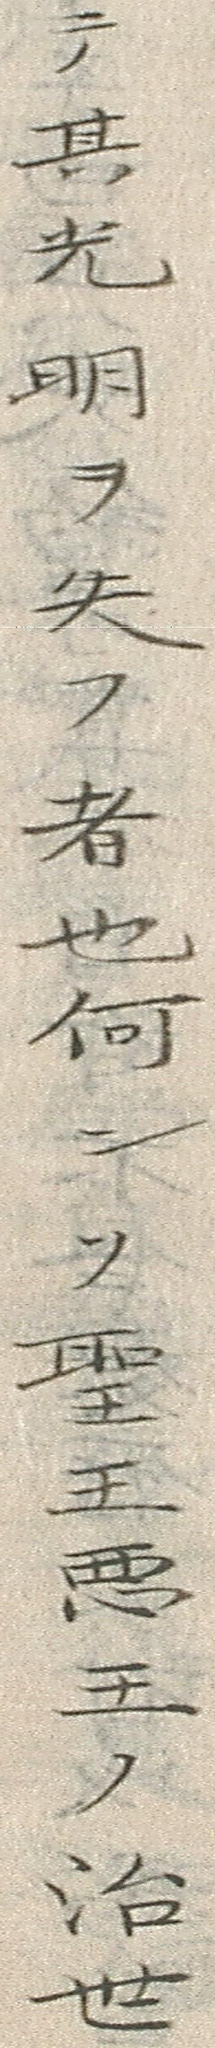テ其光明ヲ失フ者也何ンソ聖王悪王ノ治世
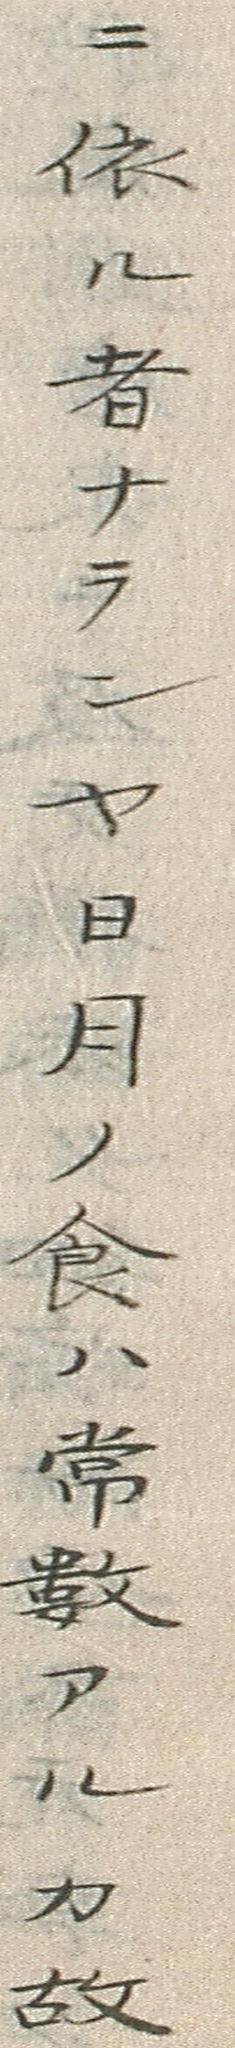ニ依ル者ナランヤ日月ノ食ハ常数アルカ故
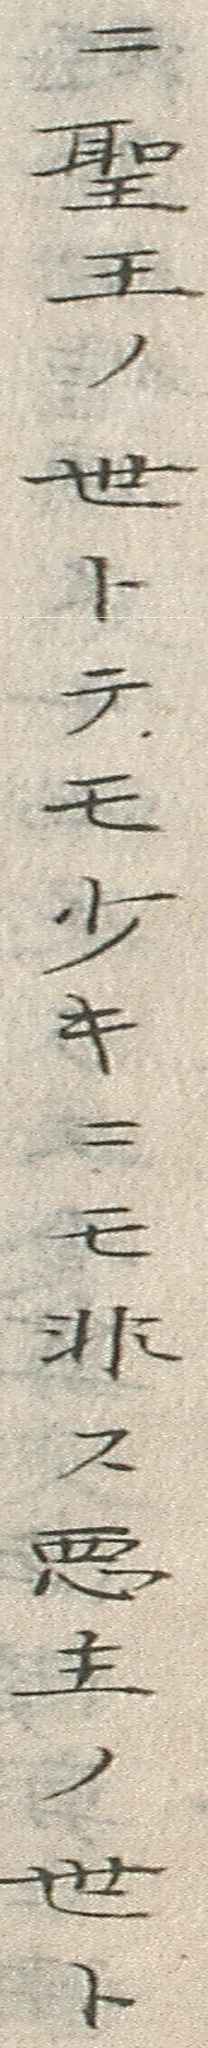ニ聖王ノ世トテモ少キニモ非ス悪王ノ世ト
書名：天學略名目羽翼　全
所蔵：東京大学地震研究所図書室 Earthquake Research Institute Library, The University of Tokyo, JAPAN
